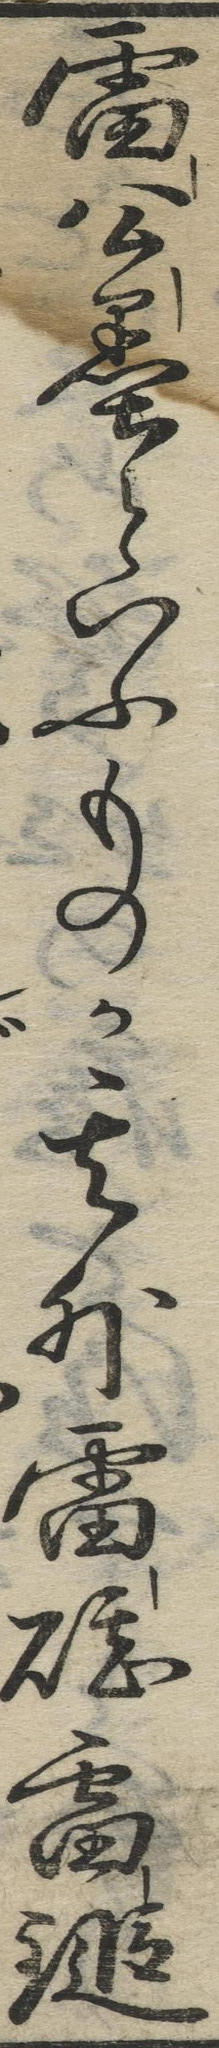雷ノ公ノ墨といふものか其外雷ノ碪雷ノ鎚
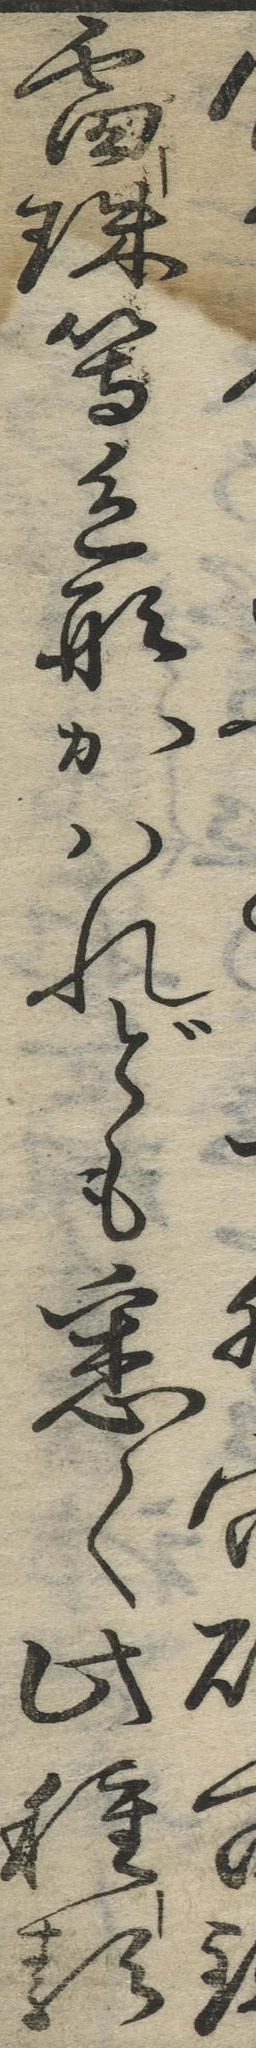雷ノ銖等色形かハれども悉く此種ノ類

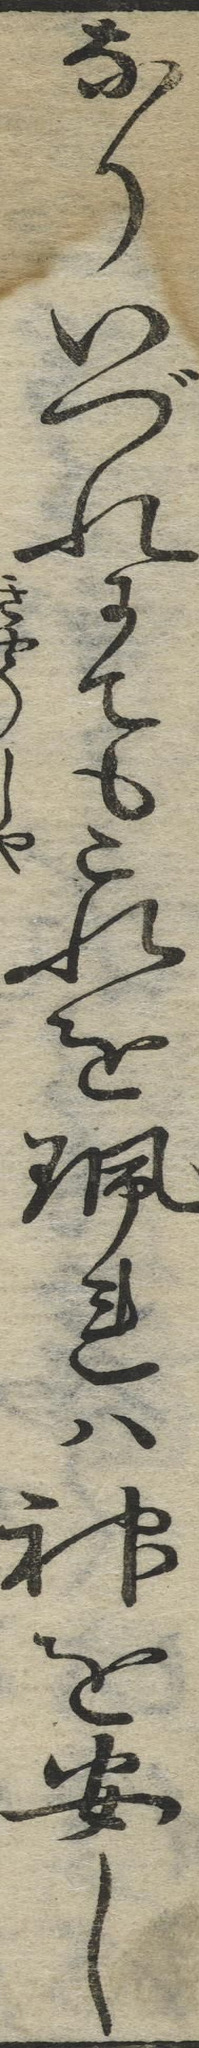なりいづれにてもこれを珮れハ神を安し
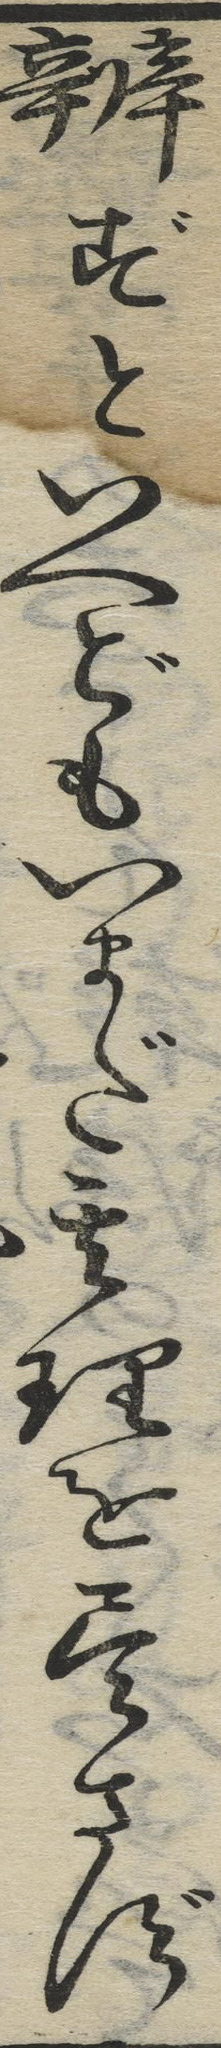弁ずといへどもいまだ其理を尽さず
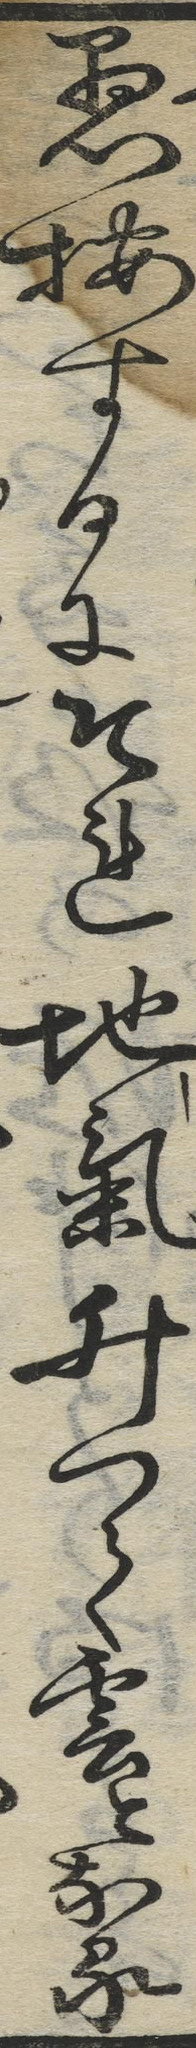愚按するにそれ地ノ気升つて雲となる
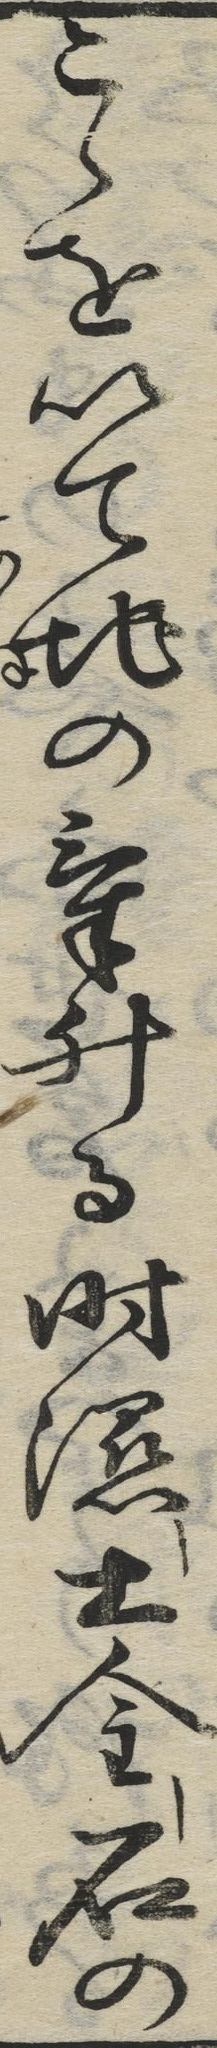こゝを以て地の気昇る時湿土金石の
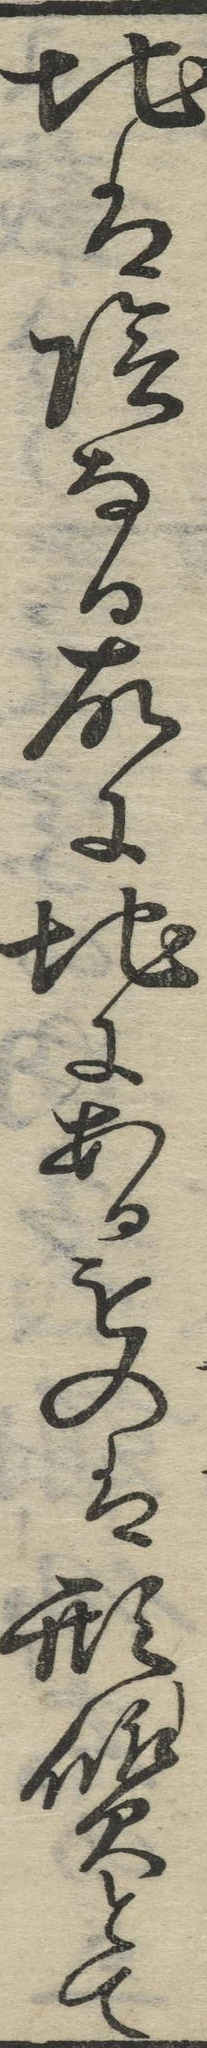地は冷なる故に地にあるものは形ノ質とて
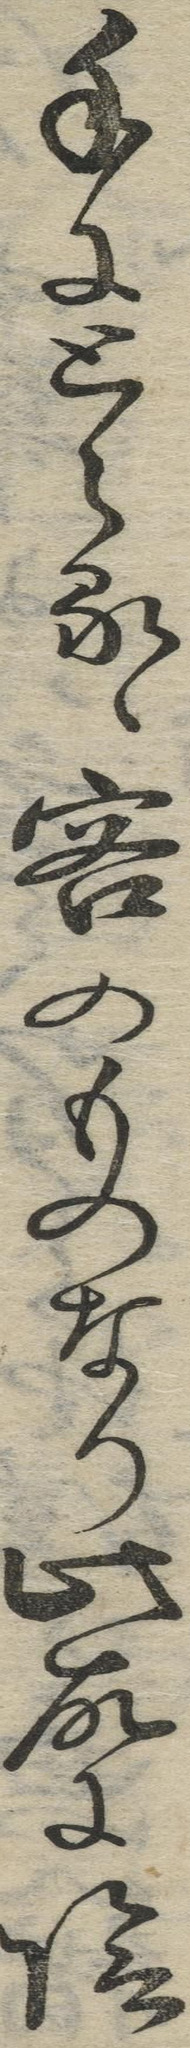手にとらるゝ容のものなり此故に陰
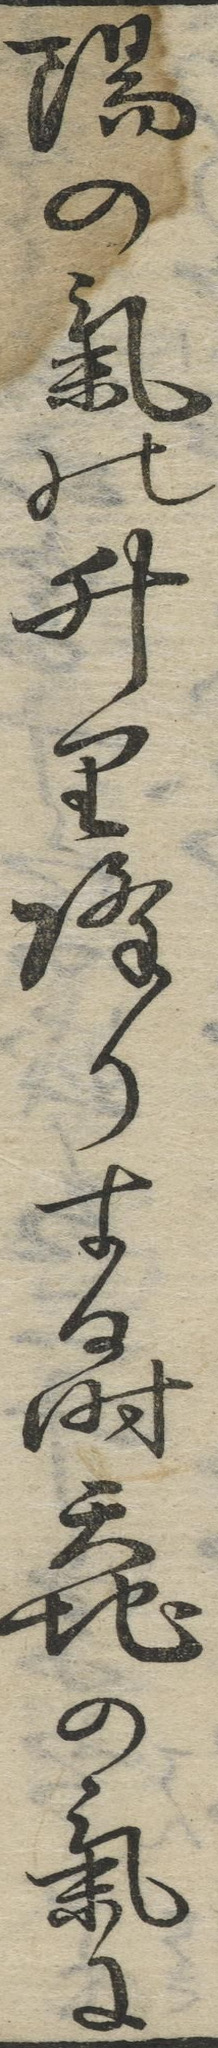陽の気の登り降りする時天地の気に
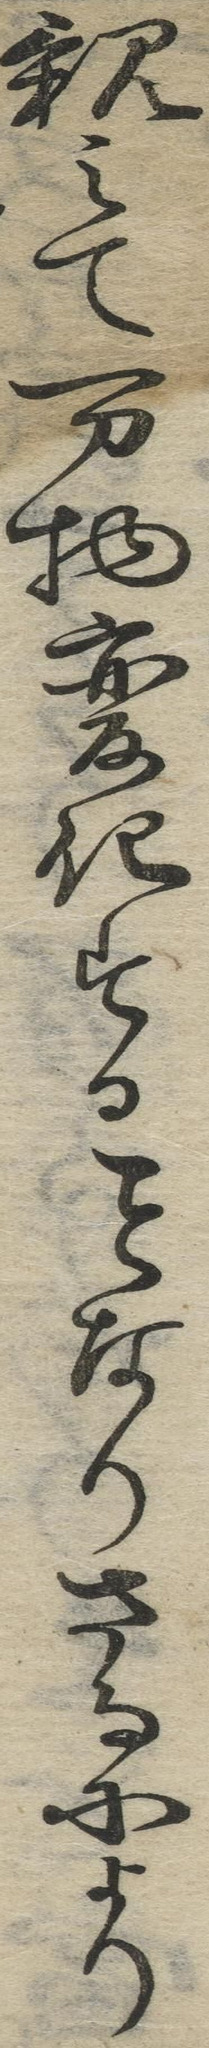親ミて万物変化することなりさるにより
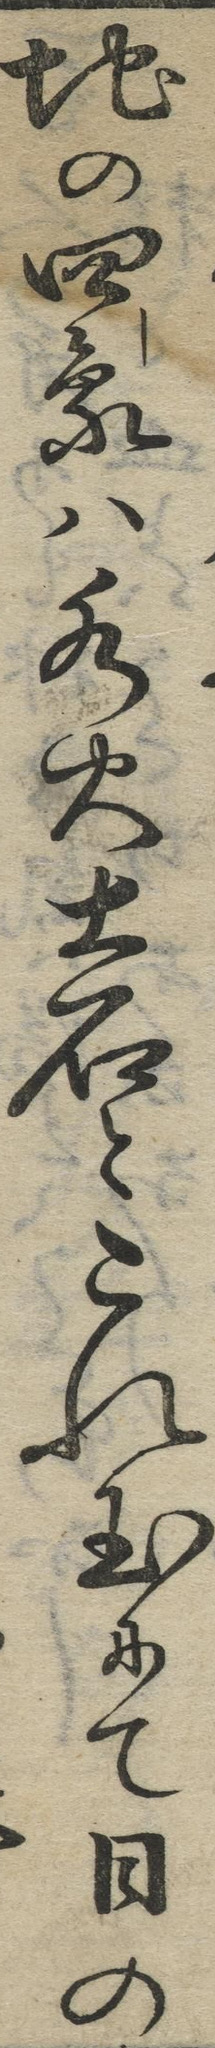地の四ノ象ハ水火土石とこれ至にて日の
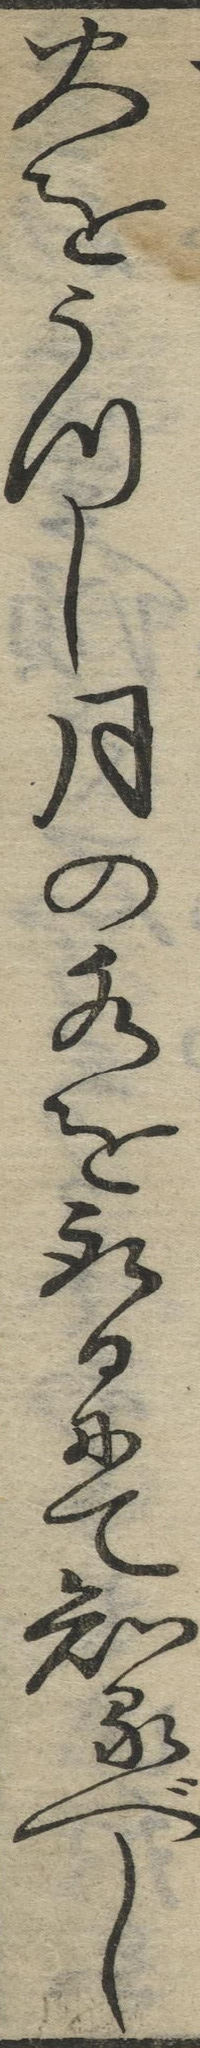火をうつし月の水を取るにて知るべし

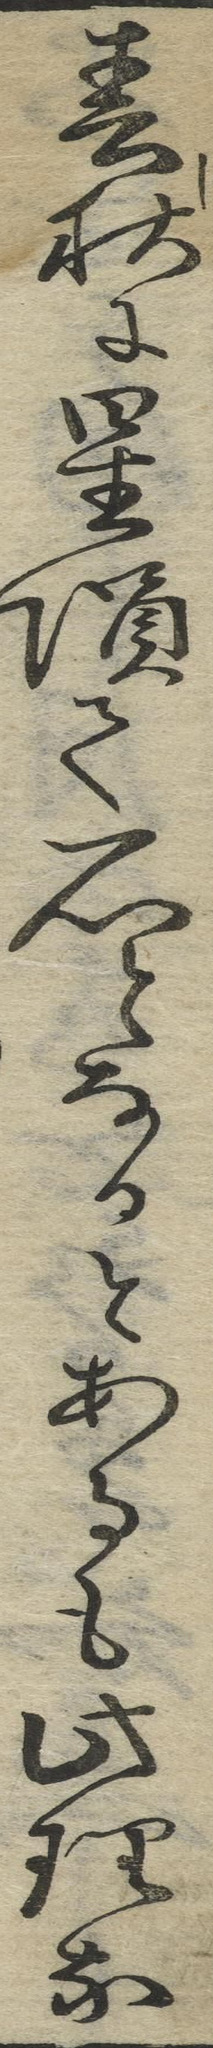春秋に星頂て石となるとあるも此理な
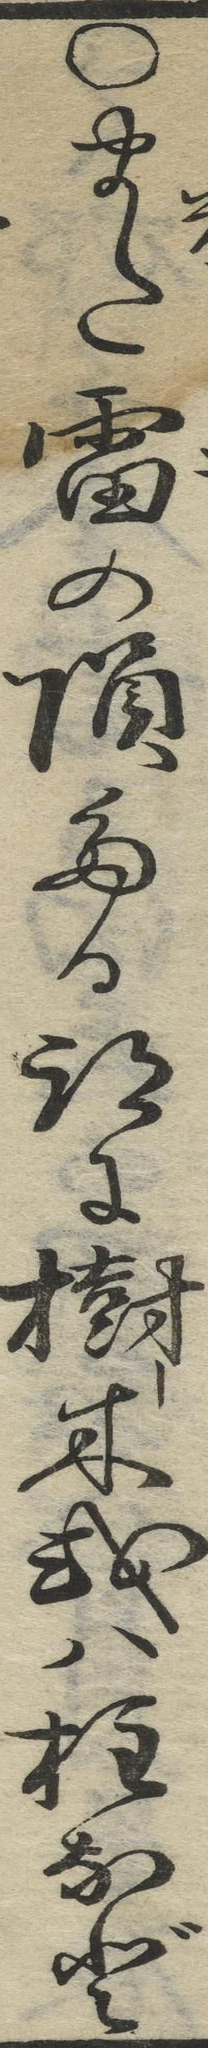〇また雷の隕たる跡に樹木或ハ柱など
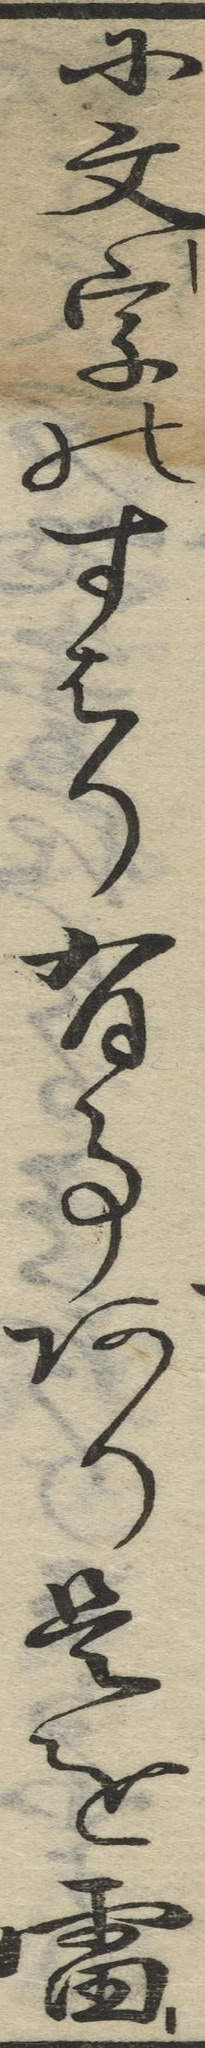に文字のすはり有事あり是を雷
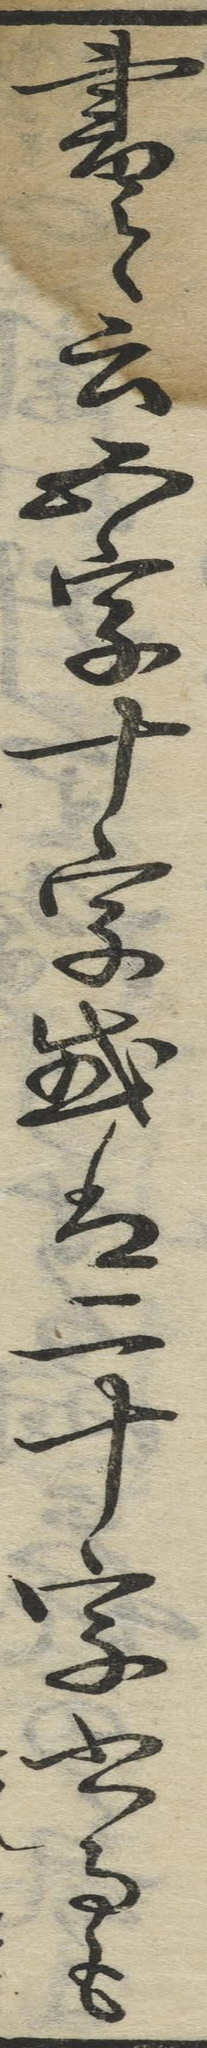書と云五字十字或は二十字出るも
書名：雷震記　完
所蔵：東京大学地震研究所図書室 Earthquake Research Institute Library, The University of Tokyo, JAPAN
